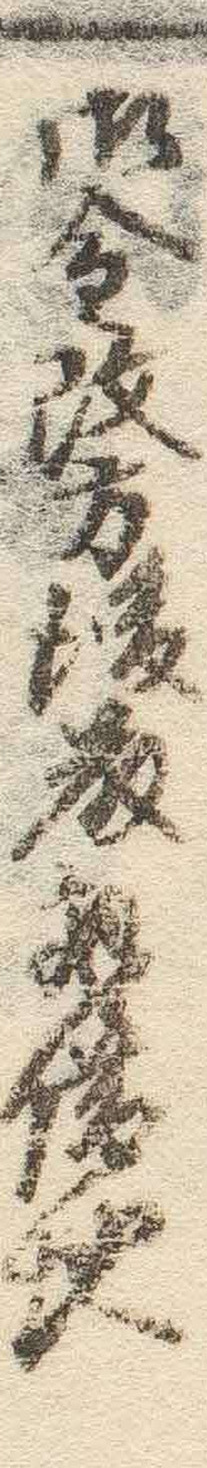御金改方後藤拝借地
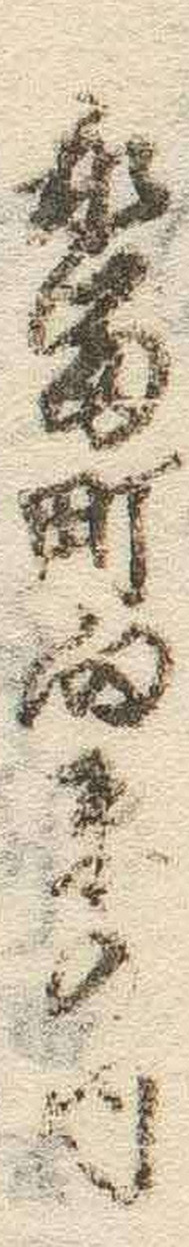永富町向原の内
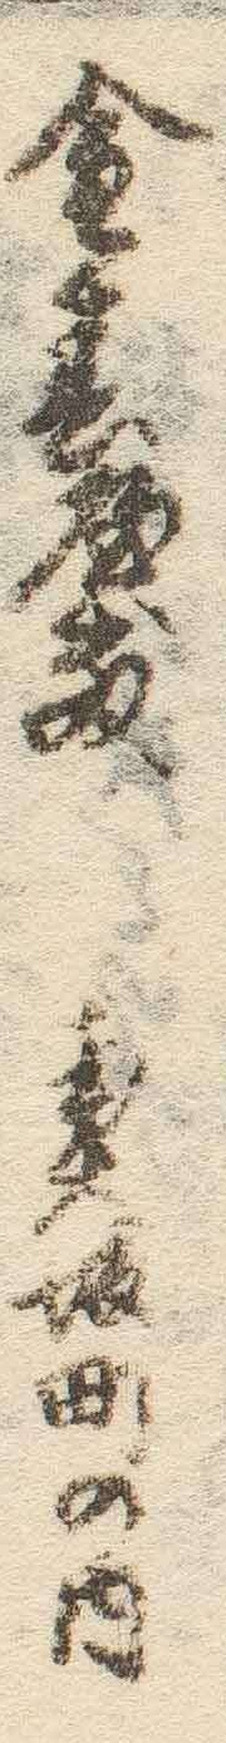金春屋敷南大坂町の内
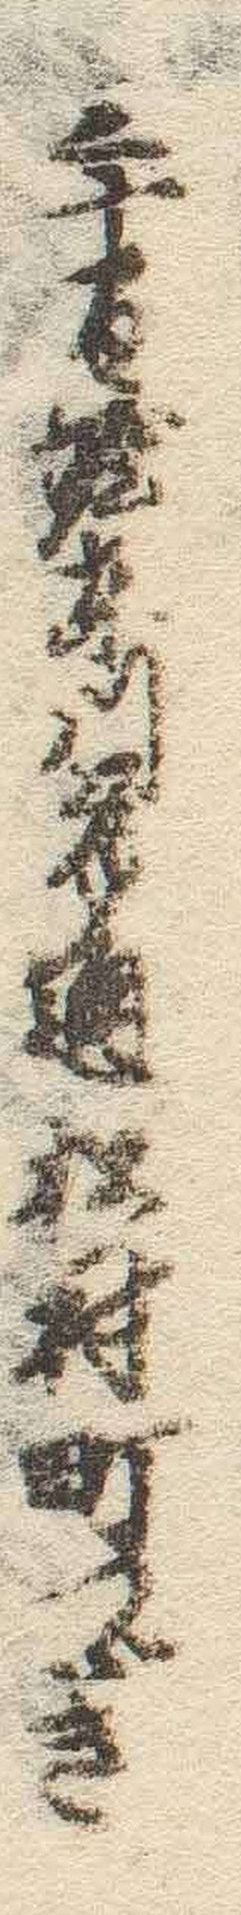三十間堀東川岸通松村町つゞき
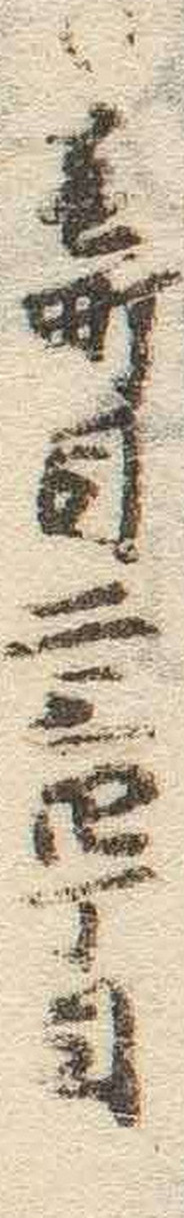壱丁目二三四丁目
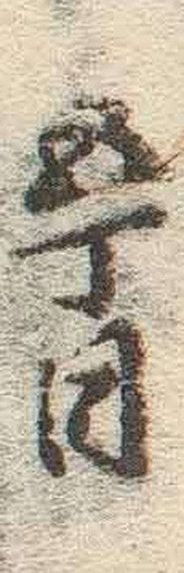五丁目
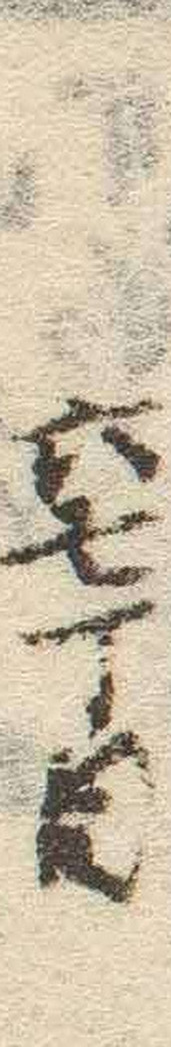六七丁目
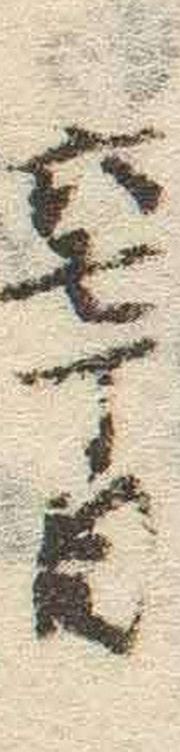六七丁目
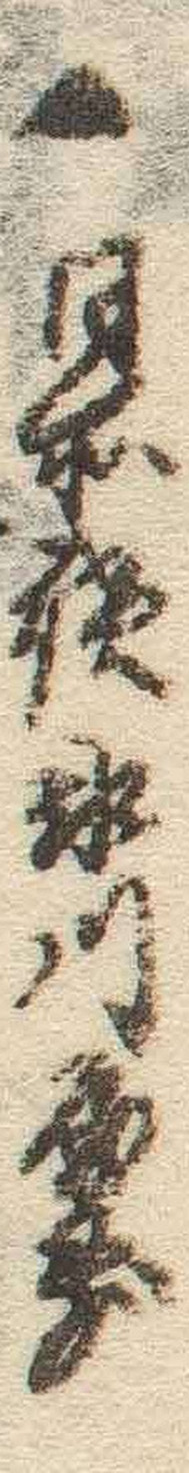▲同所続氷川屋敷
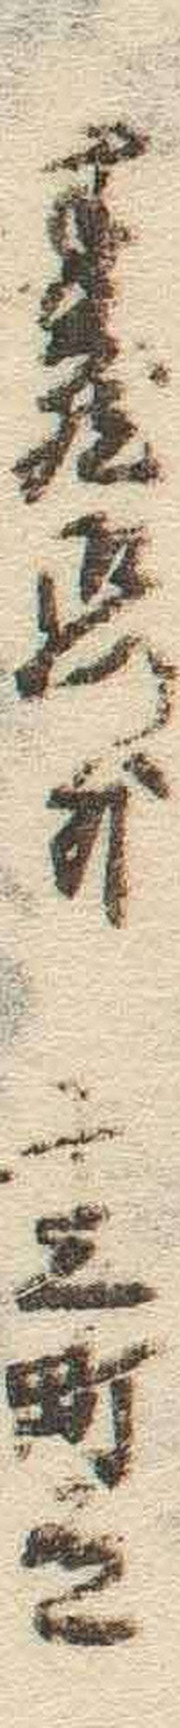麹町半蔵御門外十三町有
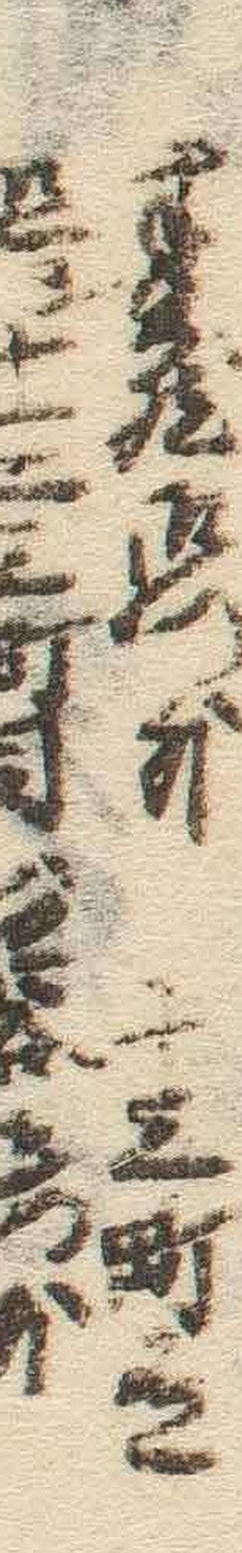但シ十一二三町目は四谷御門外
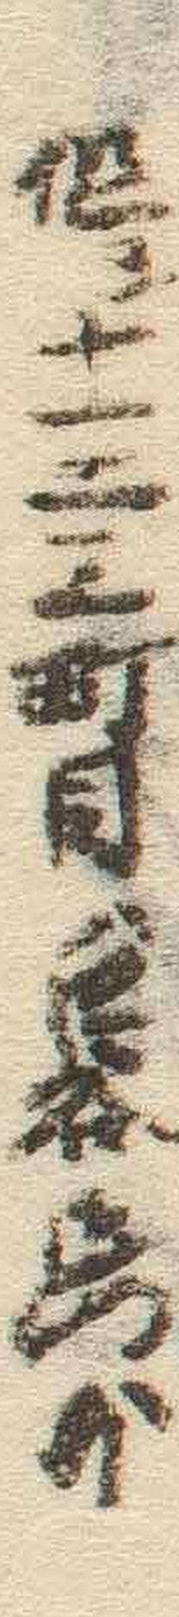但シ十一二三町目は四谷御門外

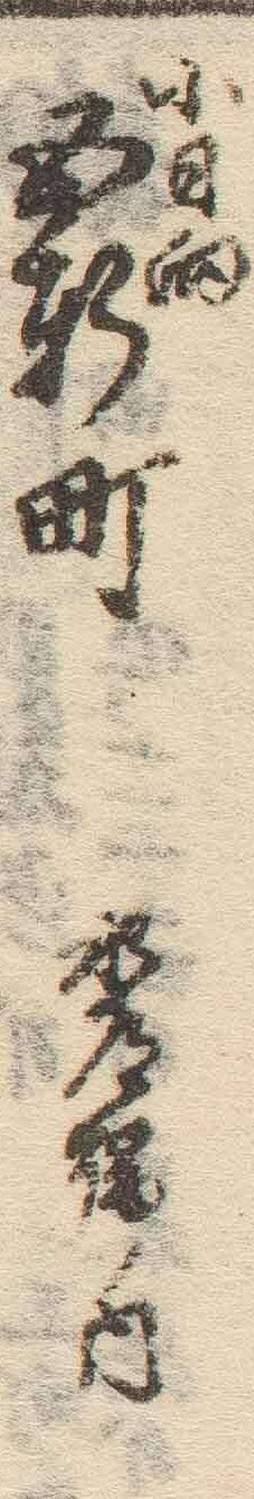五軒町水道端ノ内
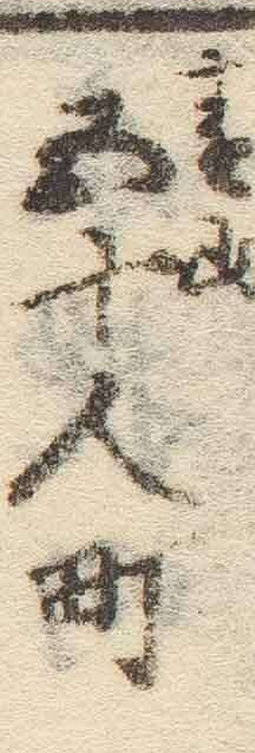五十人町
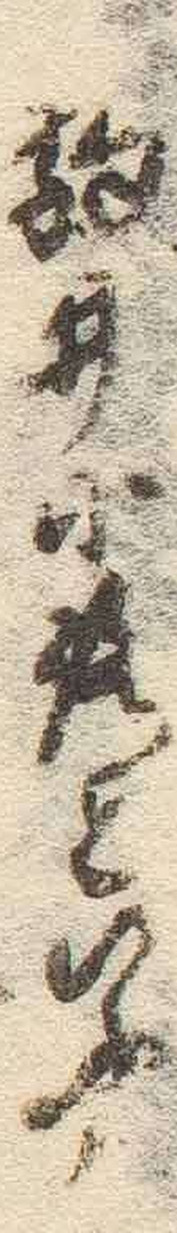駒井小路といふは
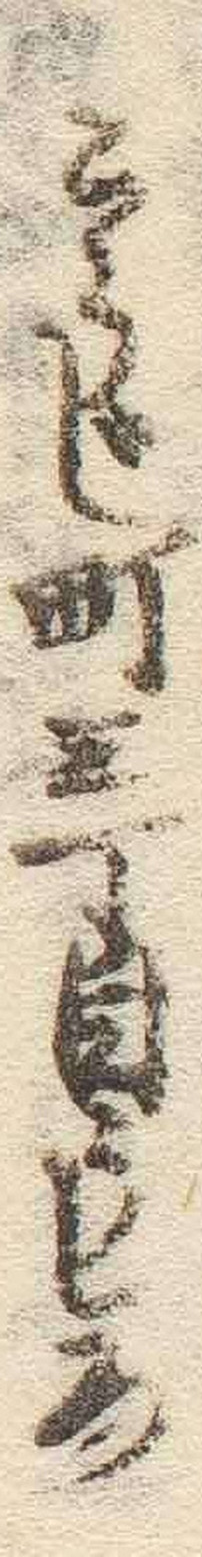こうじ町三丁目うしろ
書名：江戸町独案内
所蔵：東京学芸大学附属図書館 国文学研究資料館
